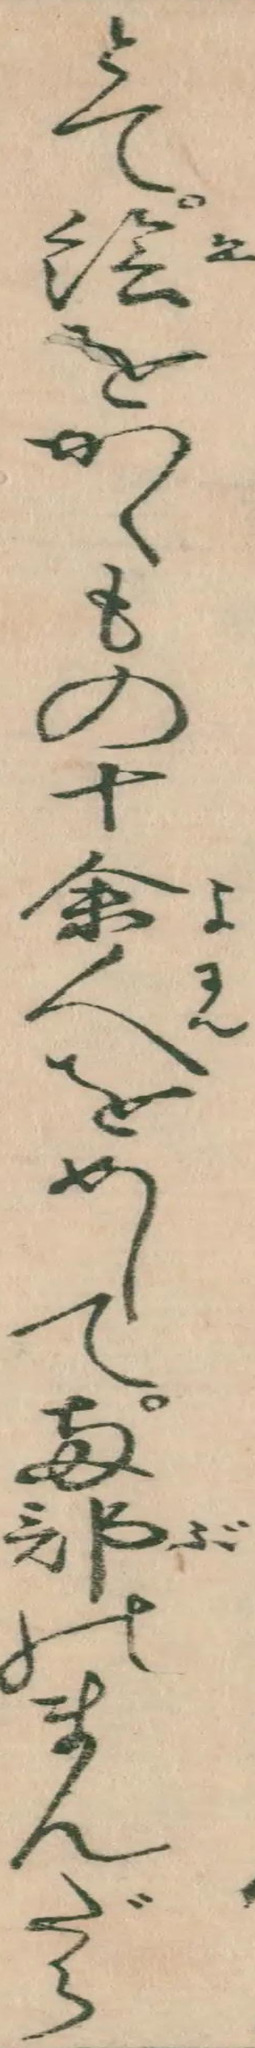とて絵をかくもの十余人をめして。両部のまんだら
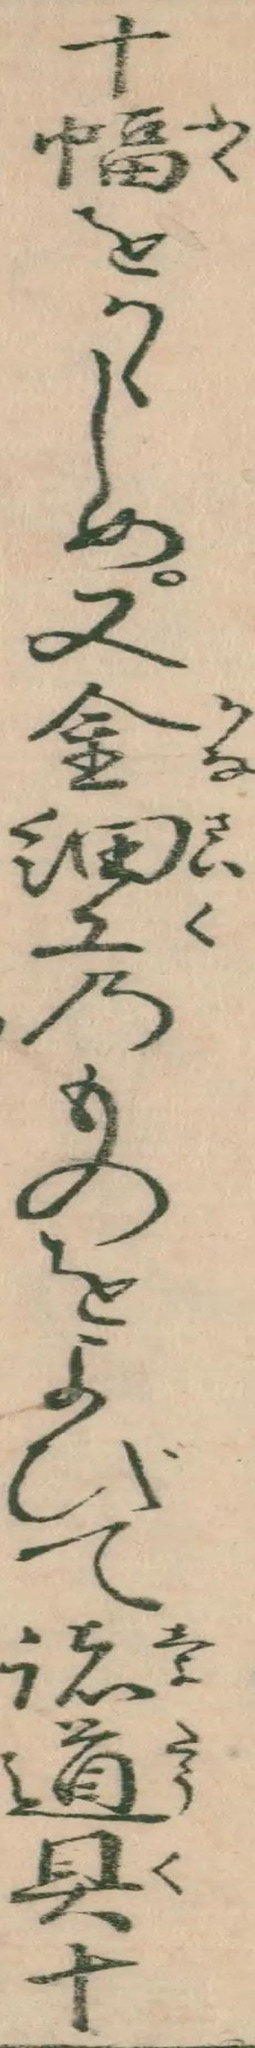十幅をかゝしめ。又金細工のものをよびて諸道具十
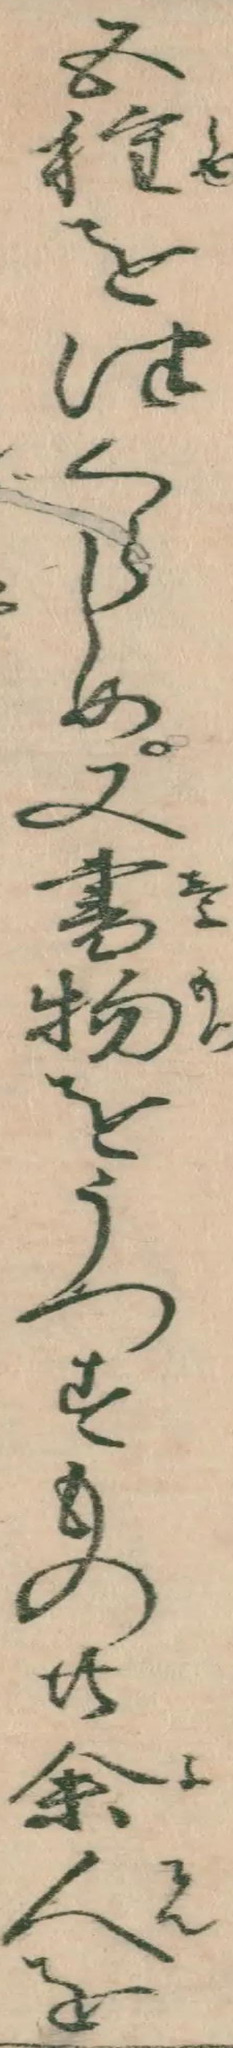五種をつくらしめ。又書物をうつすもの廿余人を
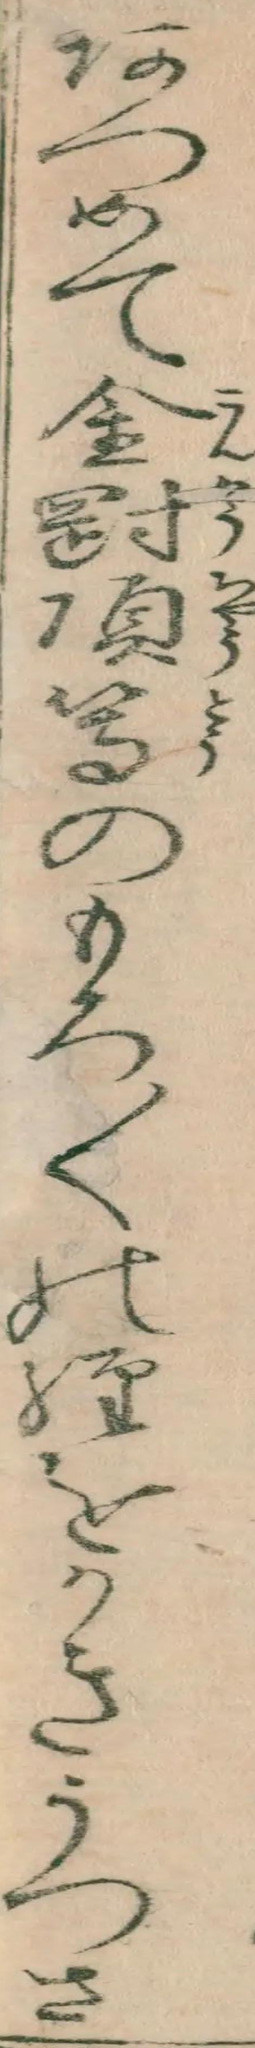あつめて金剛頂等のもろ〳〵の経をかきうつさ
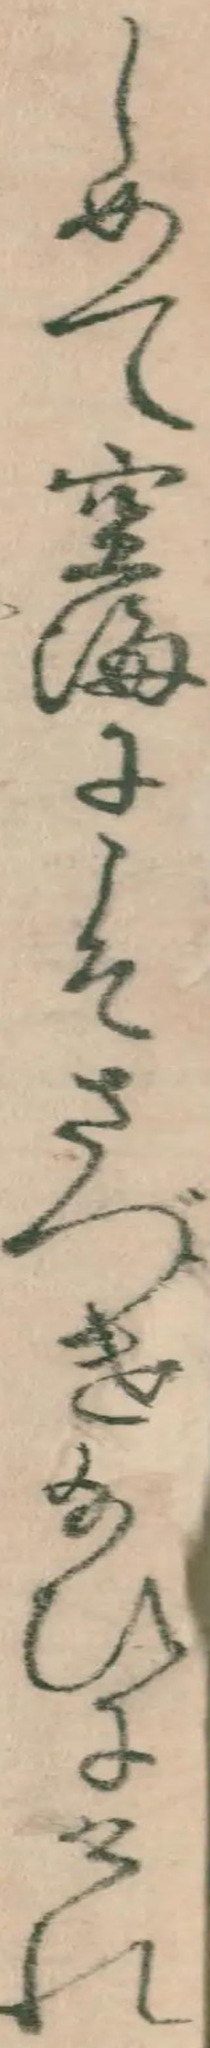しめて空海にこそさづけ給ひにけれ

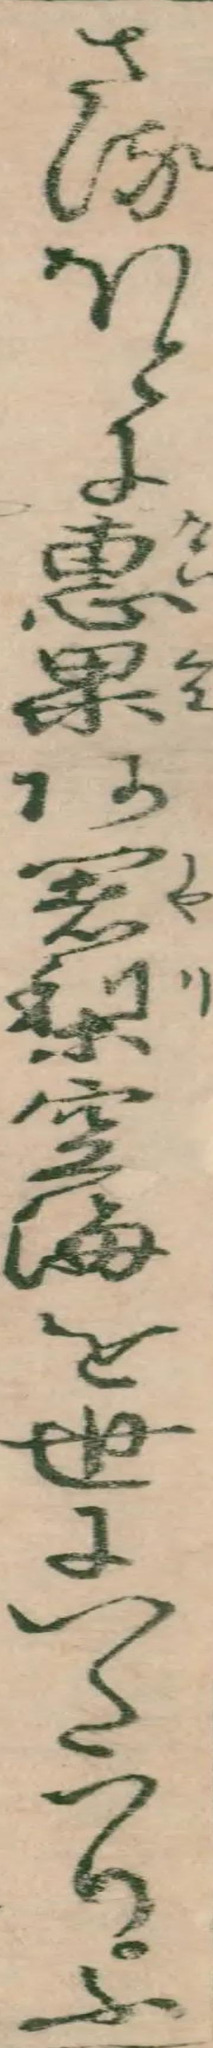さるほとに恵果阿闍梨空海を世にいたはり。ふ
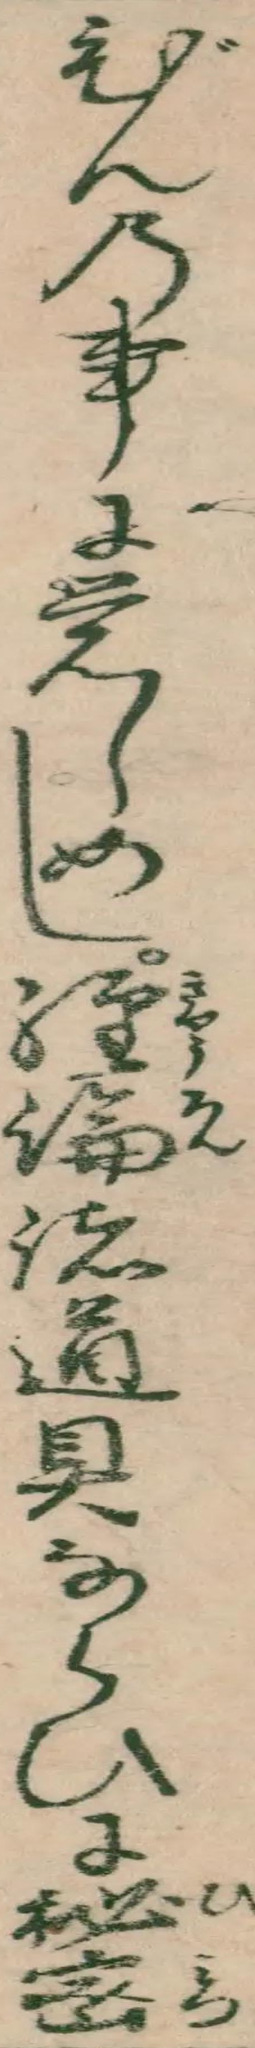びんの事に覚しめし。経論諸道具ならひに秘密
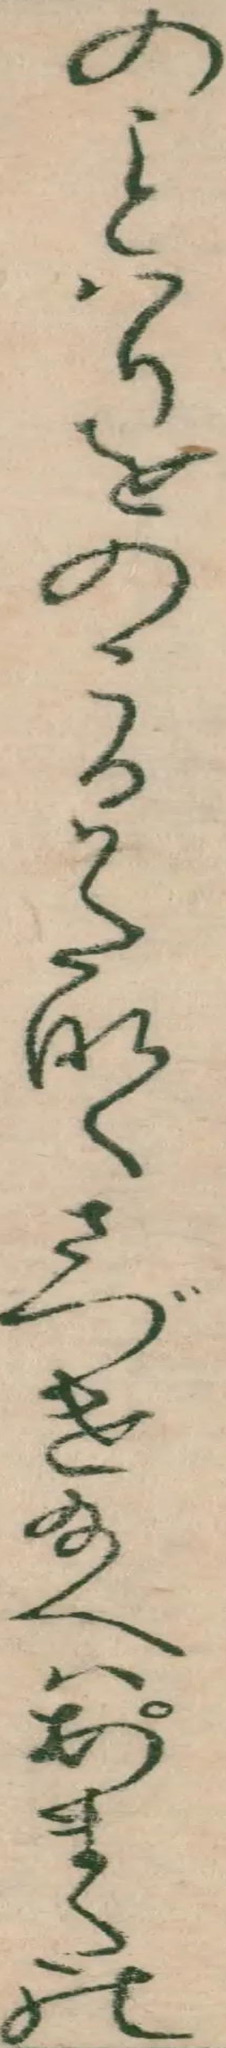のことはりをのこるかたなくさづけ給へは。あまたの
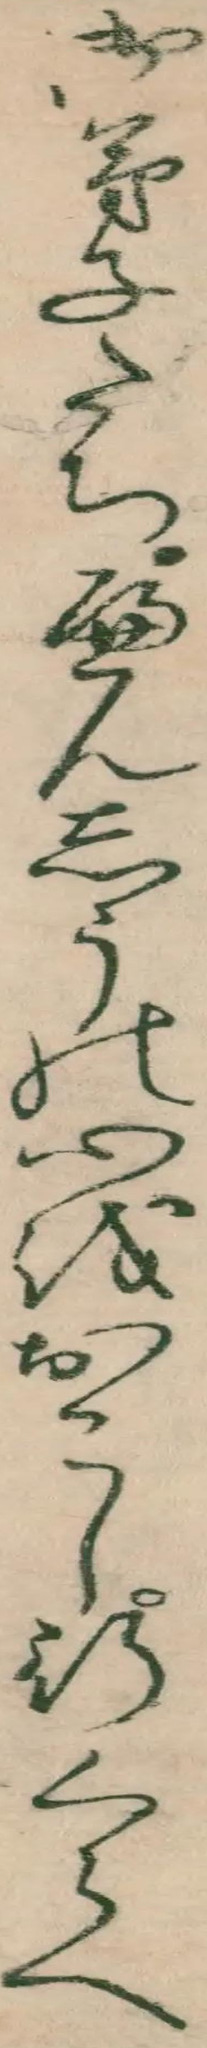御弟子たち。へんしうの心をおこし。行くらへ
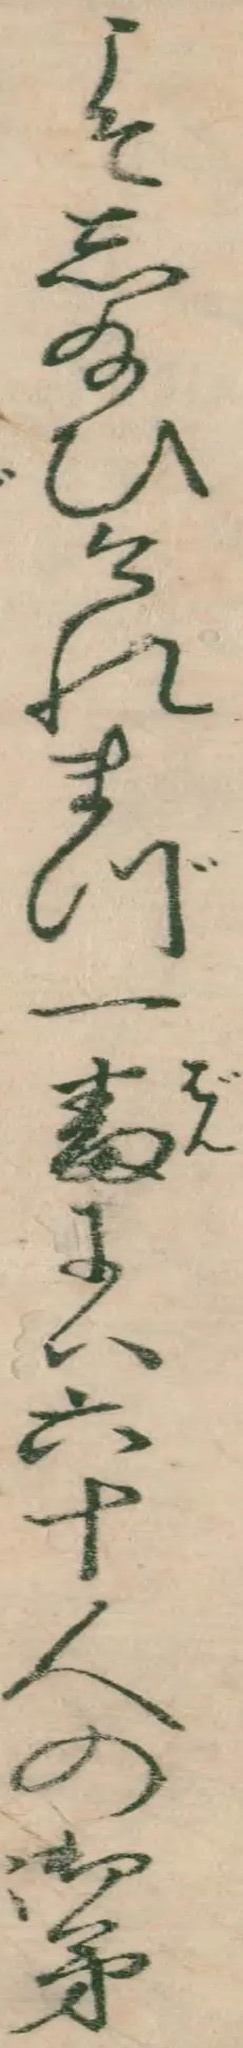こそし給ひへれまづ一番には六十人の御弟
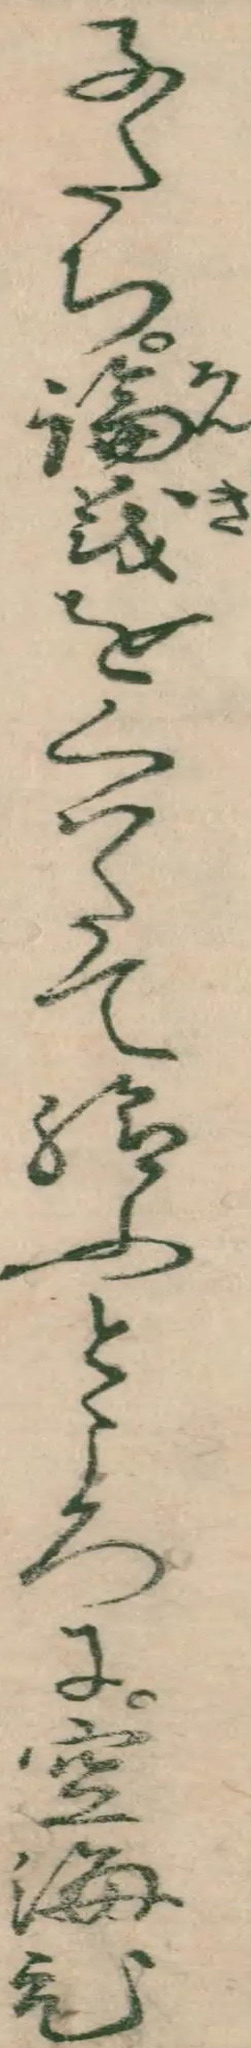子たち。論義をくはたて給ふところに。空海ひ
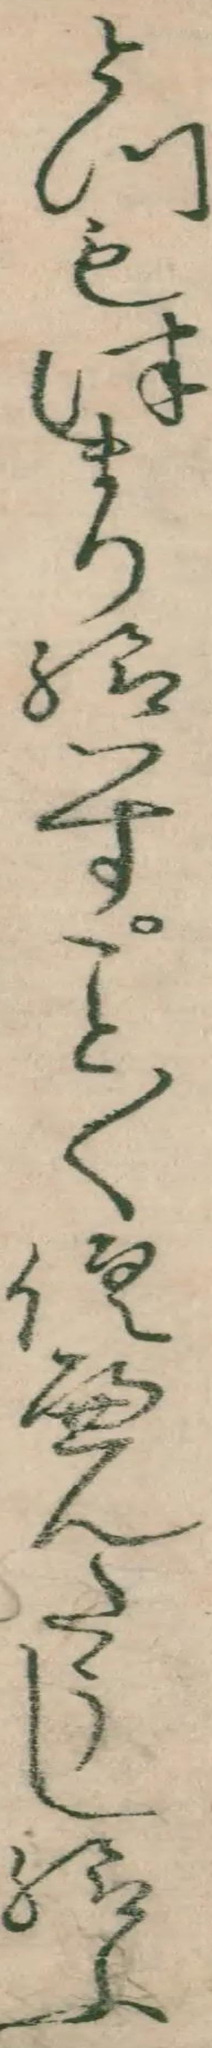とつもつまり給はす。こと〳〵くへんたうし給ふ
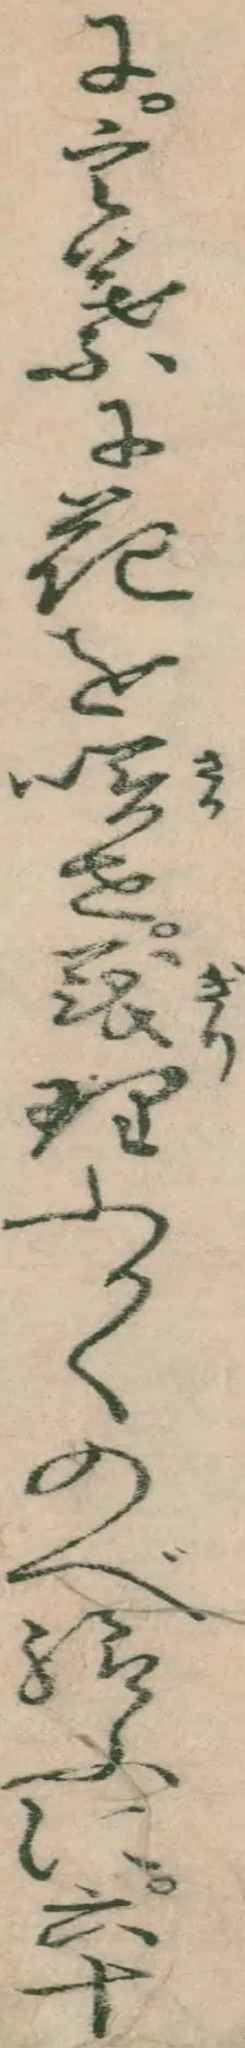に。言葉に花を咲せ。義理ふかくのべ給ふに。六十
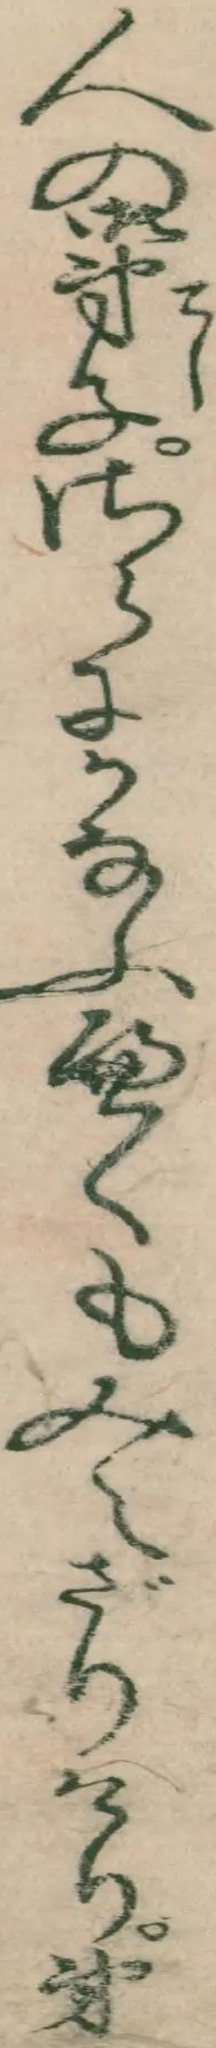人の御弟子。さらにかなふへくもみえざりけり。第
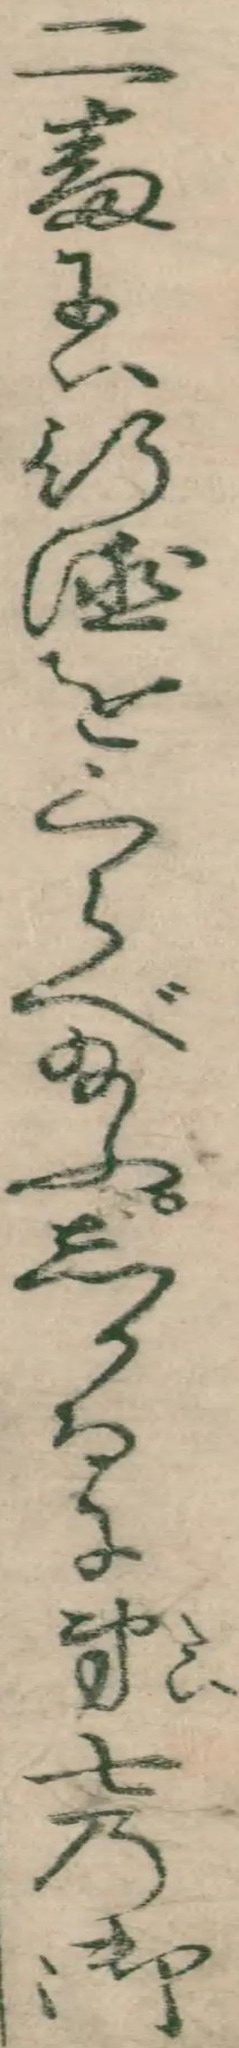二番には行徳をくらべ給ふ。しかるに第七の御

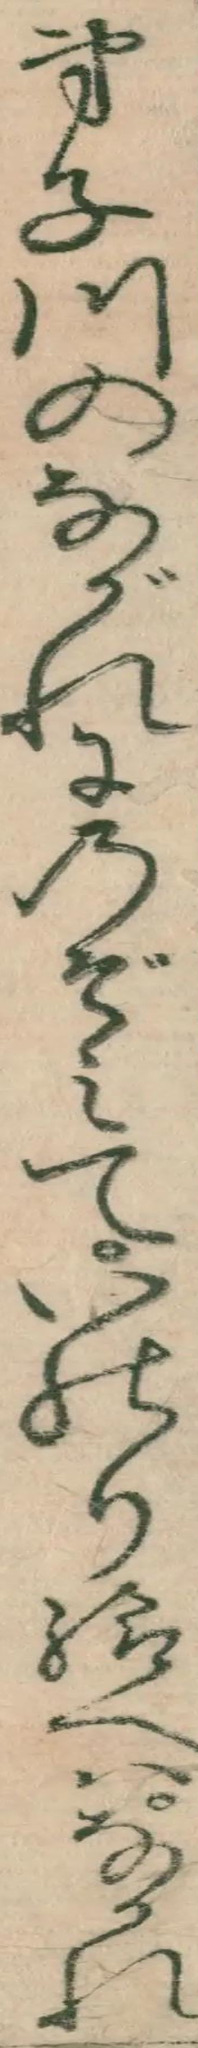弟子川のながれにのぞみて。いのり給へは。なかれ
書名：弘法大師御本地 3巻. [1]
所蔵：国立国会図書館 National Diet Library, JAPAN
